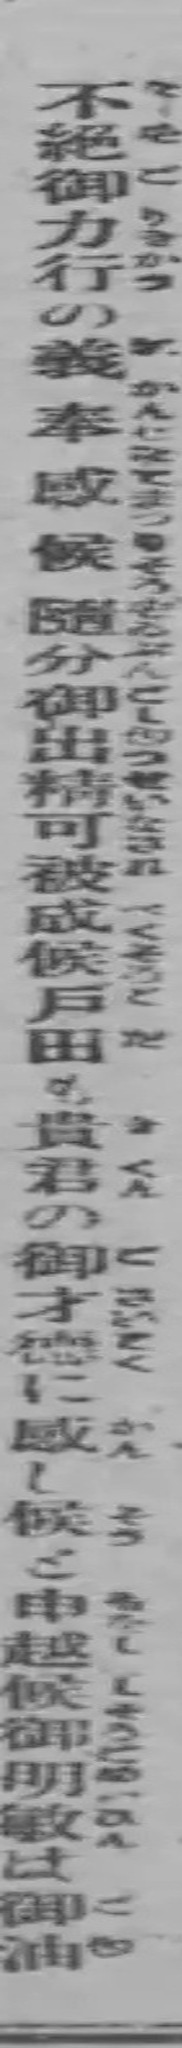信明の性行不絶御力行の義奉感候随分御出精可被成候戸田も貴君の御才徳に感し候と申越候御明敏は御油
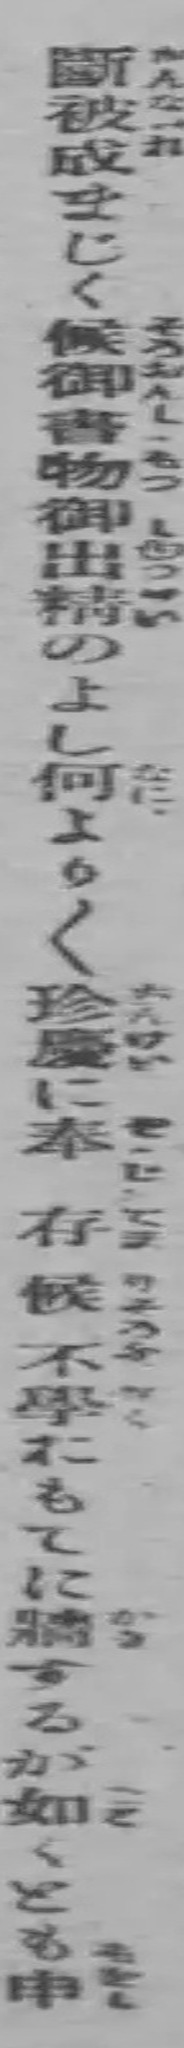断被成まじく候御書物御出精のよし何より〳〵珍慶に奉存候不学おもてに牆するが如くとも申
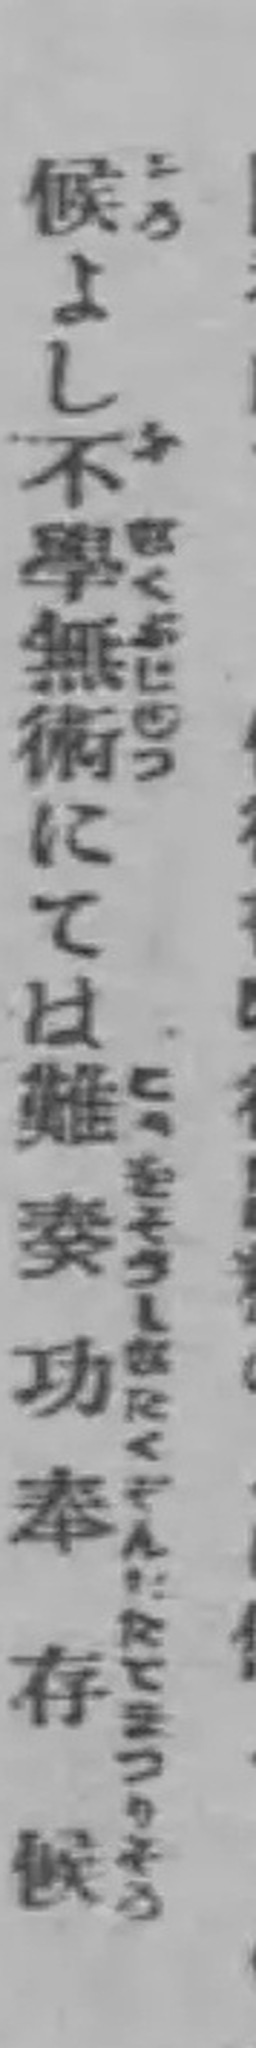候よし不学無術にては難奏功奉存候
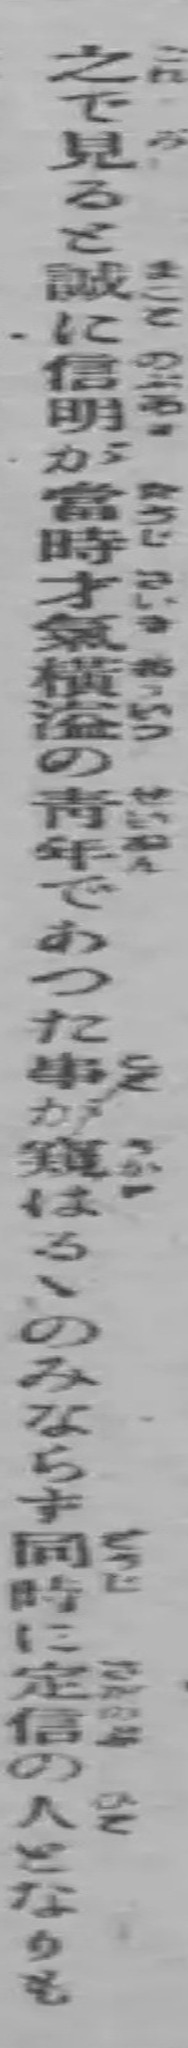之で見ると誠に信明が当時才気横溢の青年であつた事が窺はるゝのみならず同時に定信の人となりも
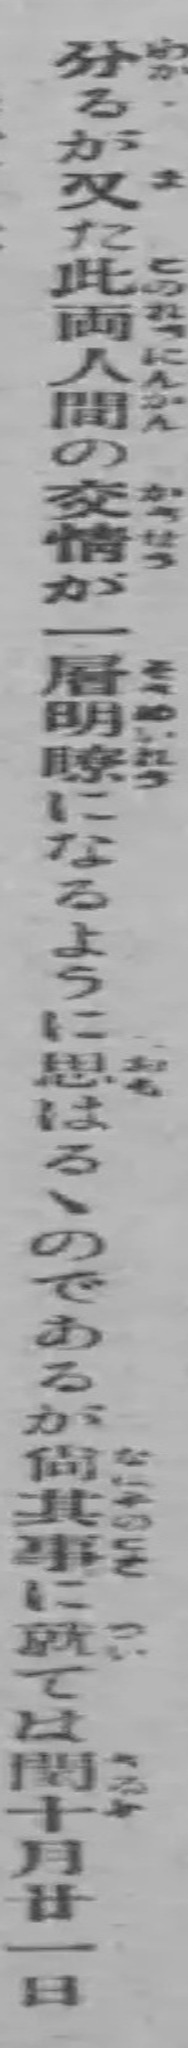分るが又た此両人間の交情が一層明瞭になるように思はるゝのであるが尚其事に就ては閏十月廿一日
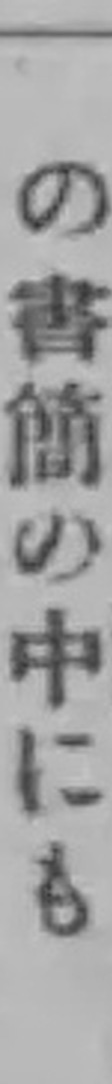の書簡の中にも
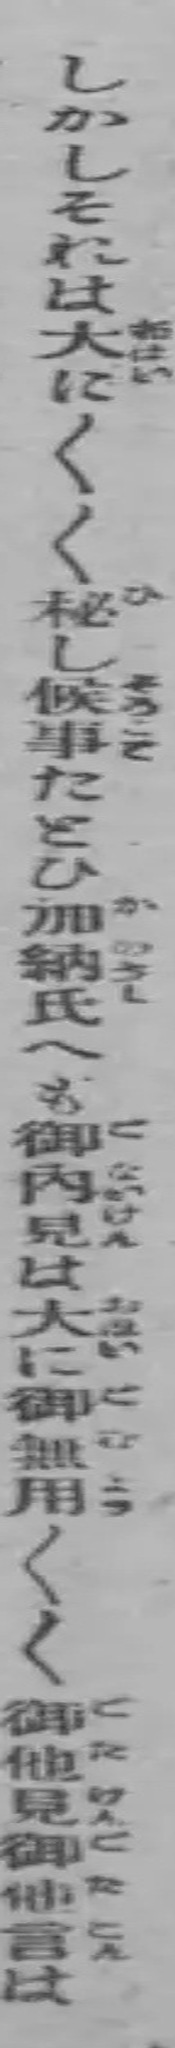しかしそれは大に〳〵〳〵秘し候事たとひ加納氏へも御内見は大に御無用〳〵〳〵御他見御他言は
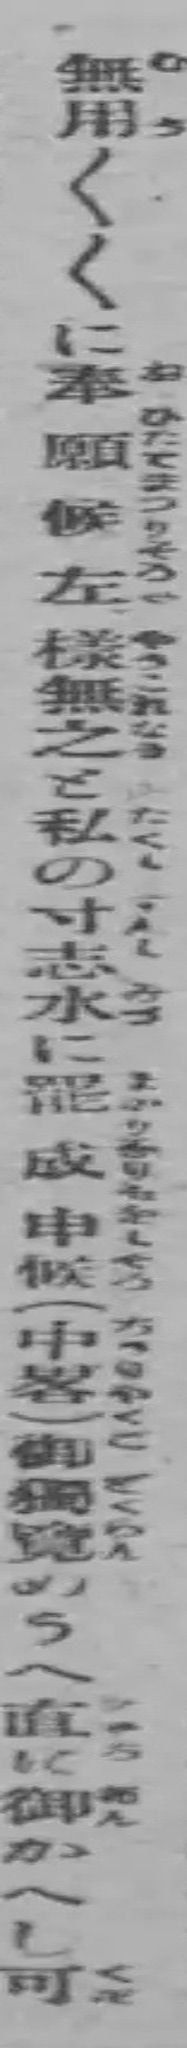無用〳〵〳〵に奉願候左様無之と私の寸志水に罷成申候(中略)御独覧のうへ直に御かへし可
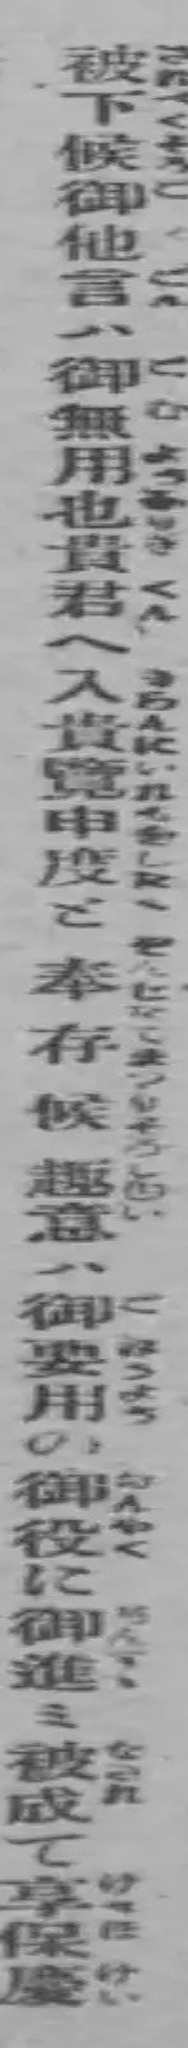被下候御他言は御無用也貴君へ入貴覧申度と奉存候趣意は御要用の御役に御進み被成て享保慶
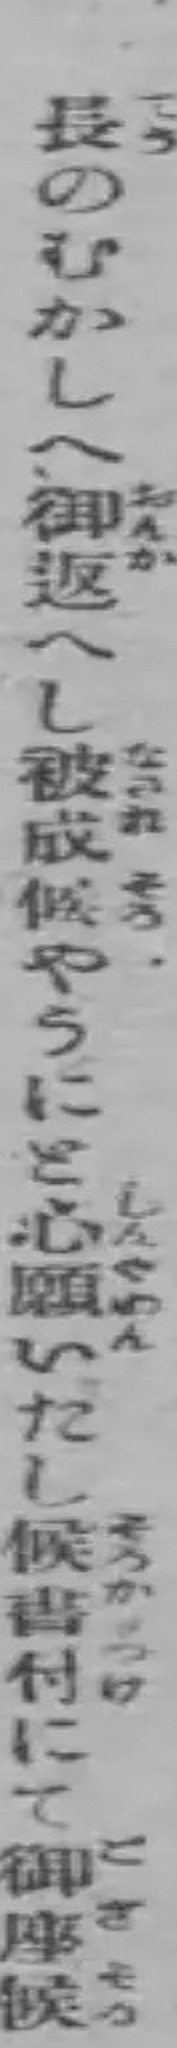長のむかしへ御返へし被成候やうにと心願いたし候書付にて御座候
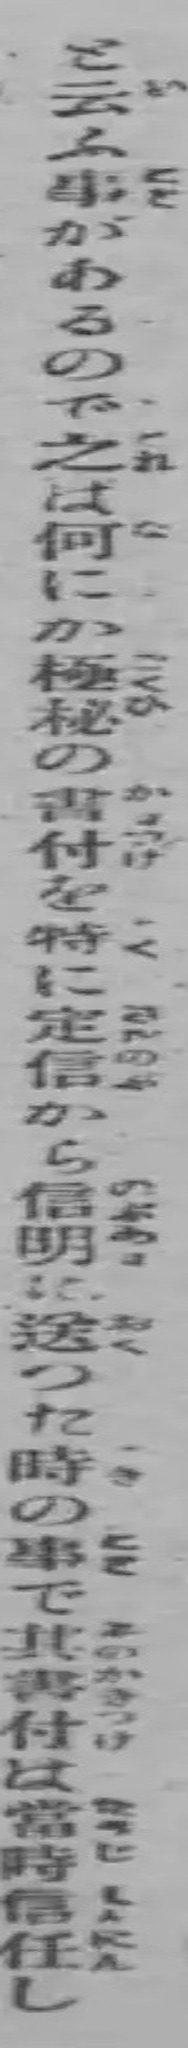と云ふ事があるので之は何にか極秘の書付を特に定信から信明に送つた時の事で其書付は当時信任し
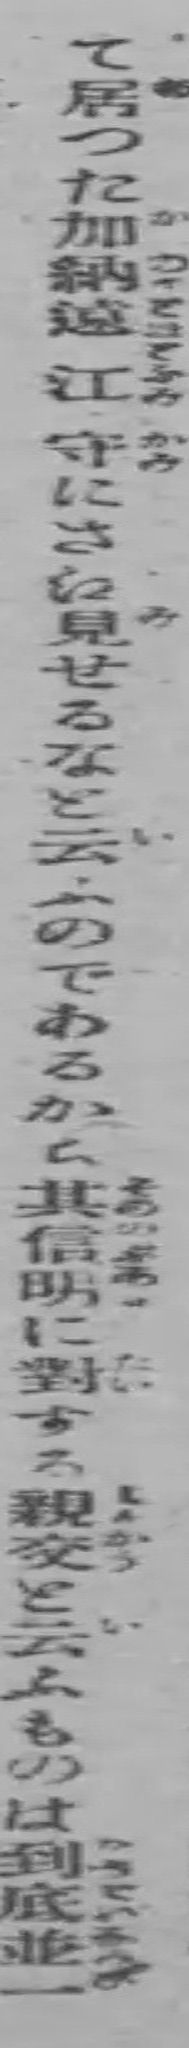て居つた加納遠江守にさえ見せるなと云ふのであるから其信明に対する親交と云ふものは到底並一
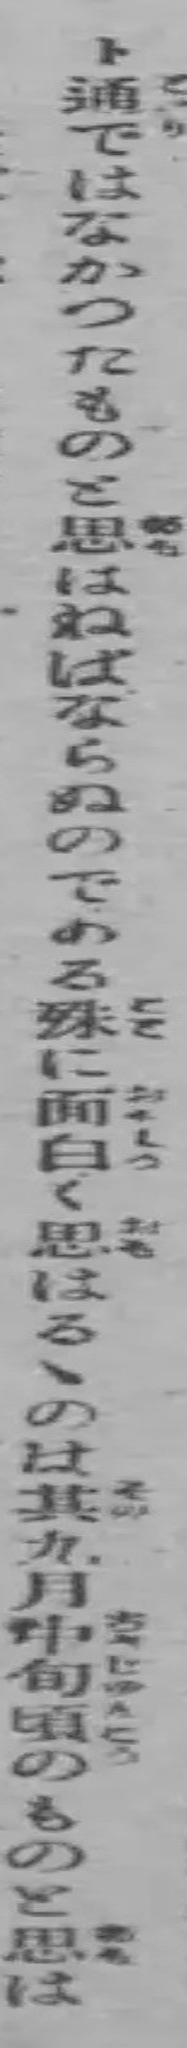ト通ではなかつたものと思はねばならぬのである殊に面白く思はるゝのは其九月中旬頃のものと思は
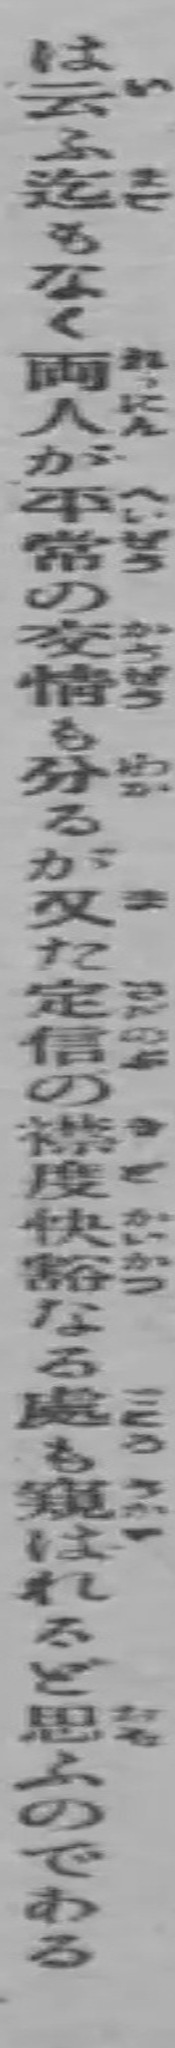定信の襟度は云ふ迄もなく両人が平常の交情も分るが又た定信の襟度快豁なる処も窺はれると思ふのである
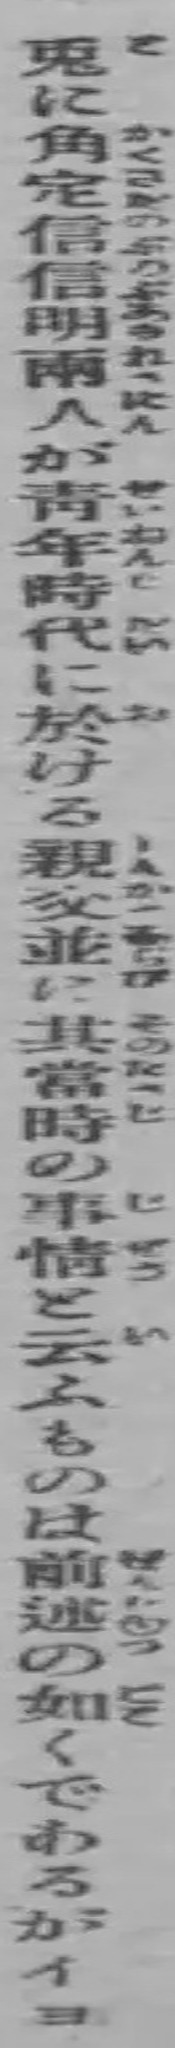兎に角定信信明両人が青年時代に於ける親交並に其当時の事情と云ふものは前述の如くであるがイヨ
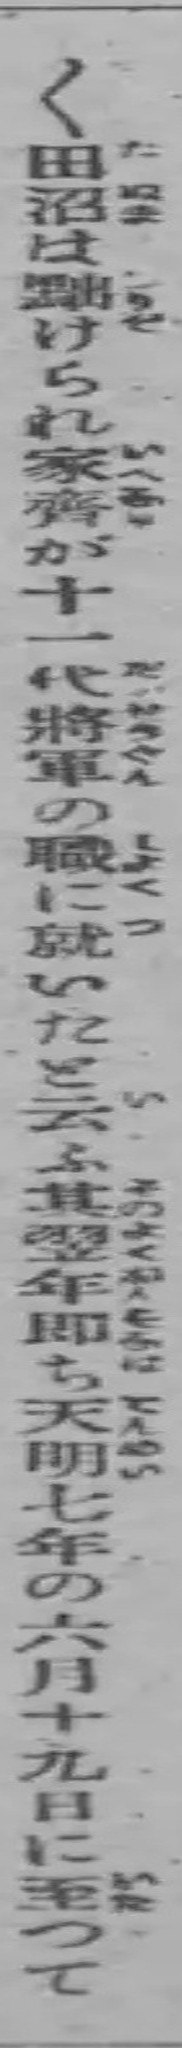〳〵田沼は黜けられ家斉が十一代将軍の職に就いたと云ふ其翌年即ち天明七年の六月十九日に至つて
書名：豊橋市史談
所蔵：国立国会図書館 National Diet Library, JAPAN
